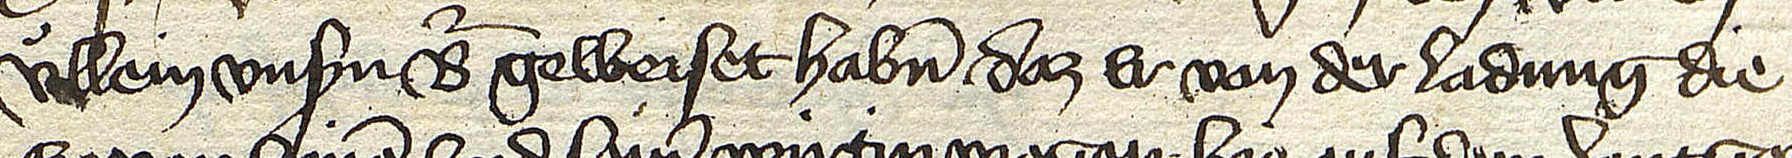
V̈llein vnſ*n B* geweiſet hab*n / daʒ Er von der ladung die
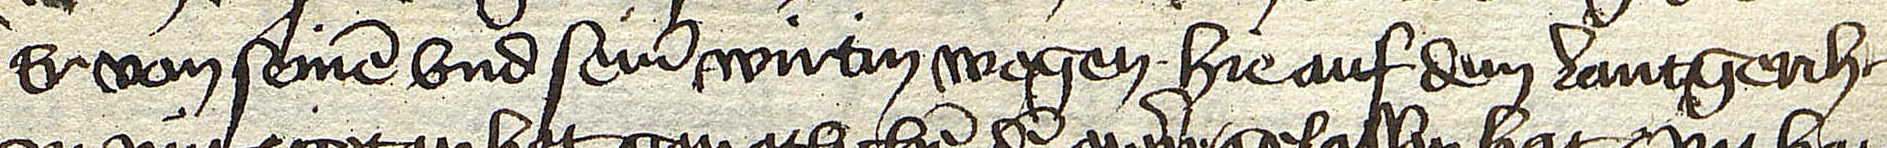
Er von ſeine* vnd ſein* wirtin wegen . hie auf dem lantgeriht
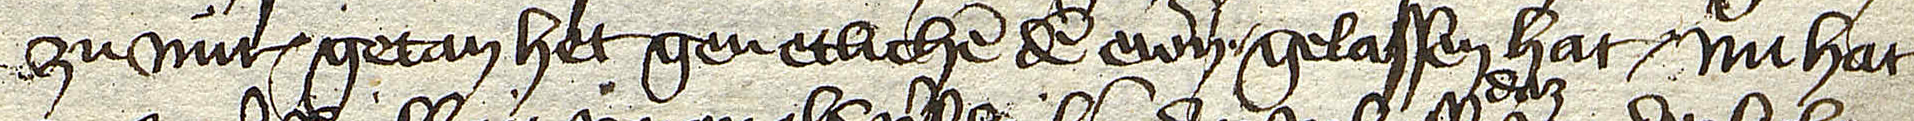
ʒu Nür* getan het gen etliche* d* ew*n gelaſſen hat / Nu hat
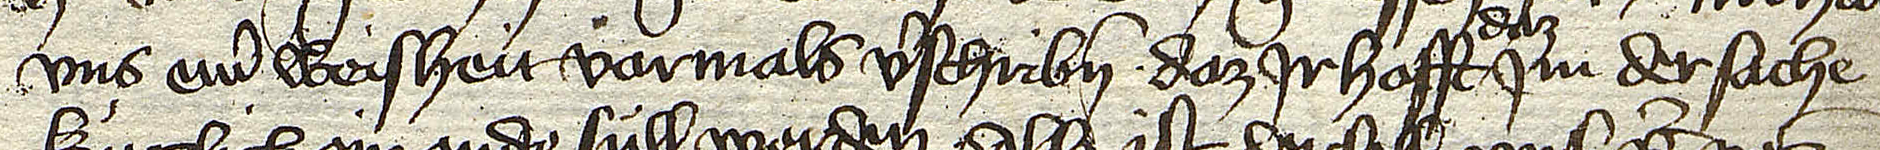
vns ew* weiſheit vormals v*ſchrib*n . daʒ Ir hofft Im der ſache
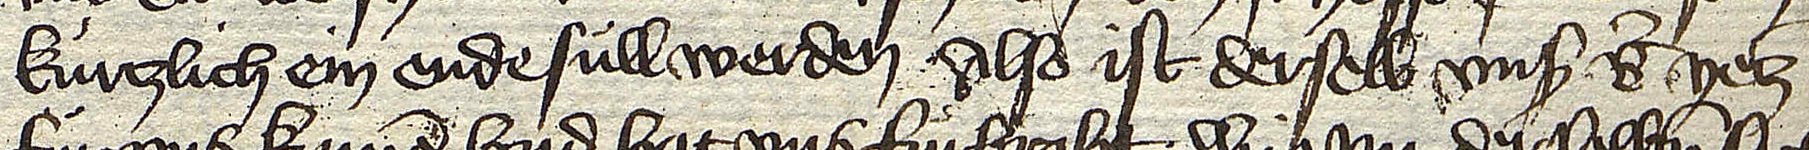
kürcʒlich ein ende ſüll werden Alſo iſt derſelb vnſ* B* yecʒ*
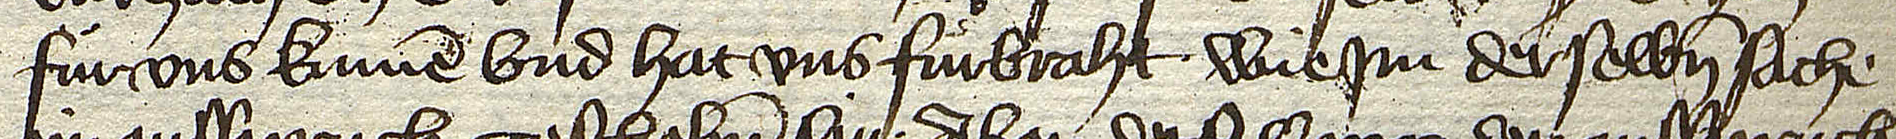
für vns kume* vnd hat vns fürbraht . wie Im derſelb*n ſache
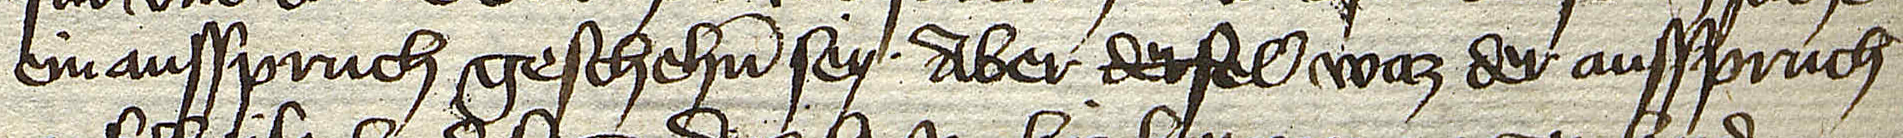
ein auſſpruch geſcheh*n ſey . Aber derſel waʒ der auſſpruch
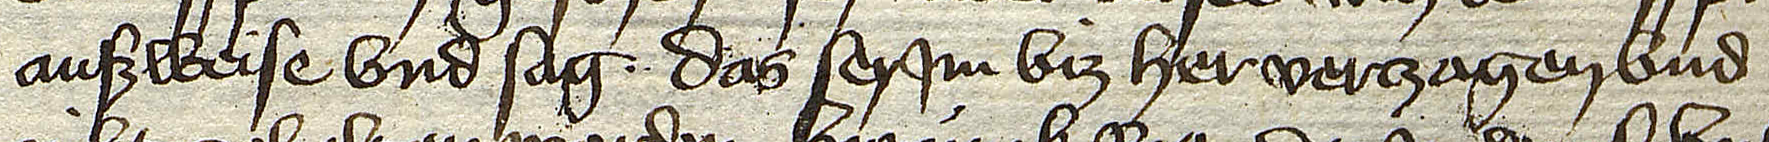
auſʒweiſe vnd ſag . das ſey Im biʒ her vercʒogen vnd
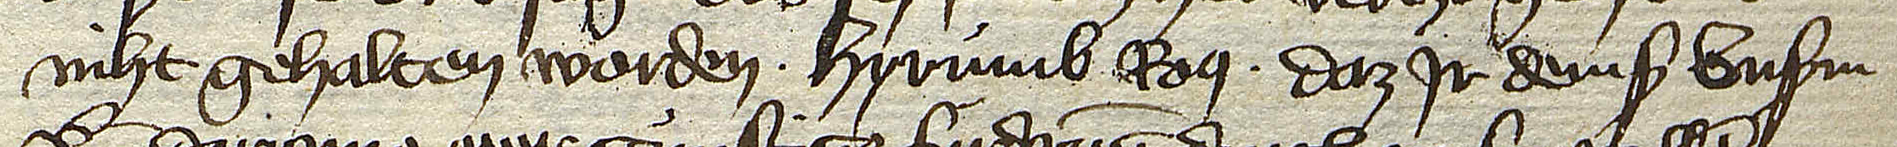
niht gehalten worden . Hyrümb Ro* daʒ Ir demſ* vnſ*m
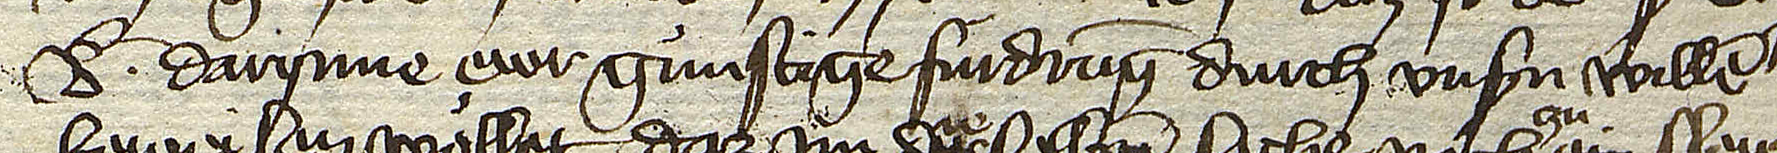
B* darynne ewr günſtige fürdru*g durch vnſ*n wille*
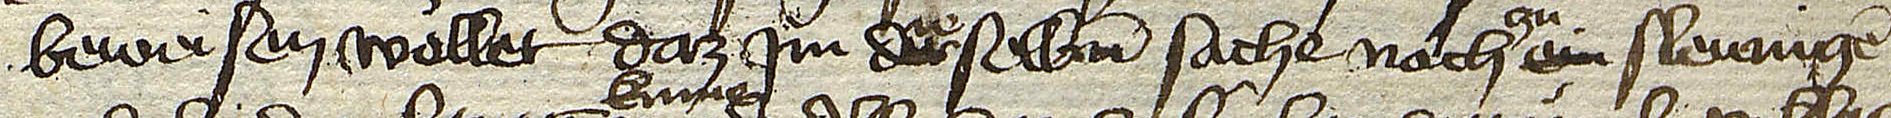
beweiſen wöllet daʒ Im derſelb*n ſache noch ein ſleunige*
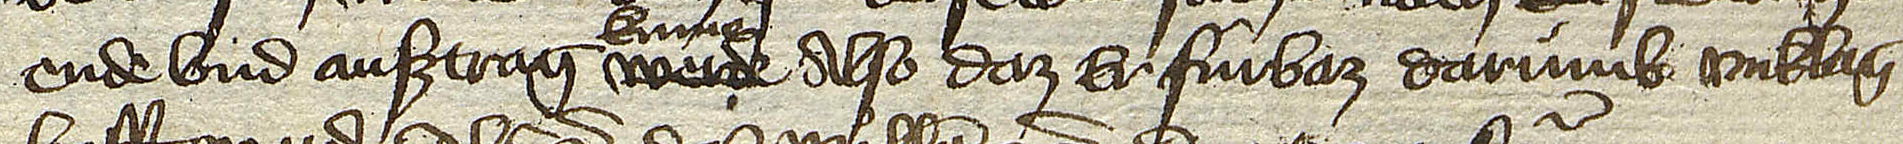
ende vnd auſʒtrag werde Alſo daʒ Er fürbaʒ darümb vnklag
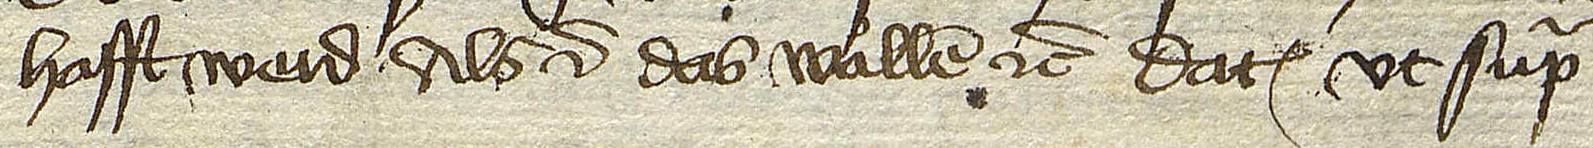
hafft werd . Alſ ec* das wölle* ec* Dat* vt ſup*
